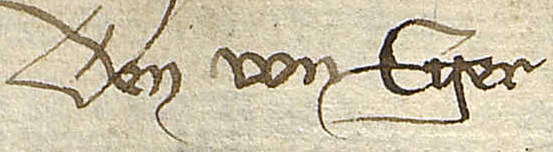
Den von Eger
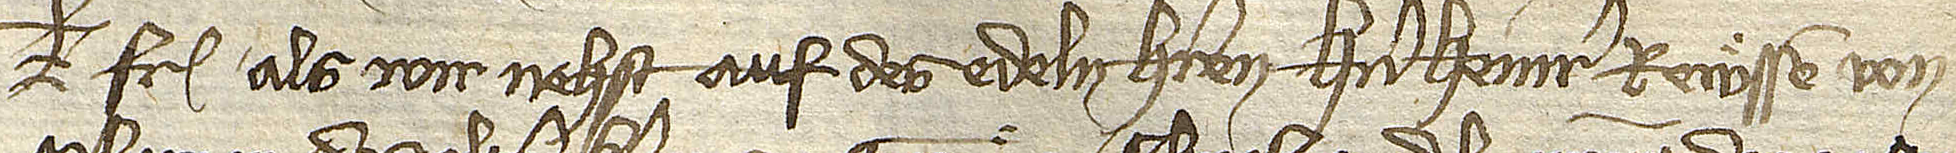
L* fr* / als wir nehſt auf des edeln h*ren Hn* Heinr* Reẅſſe von
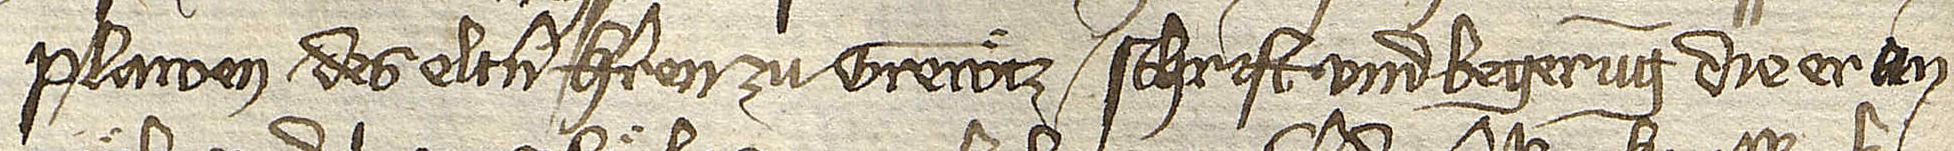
Plawen / des eltn* h*ren ʒu Greẅcʒ / ſchrift vnd begeru*g die er an
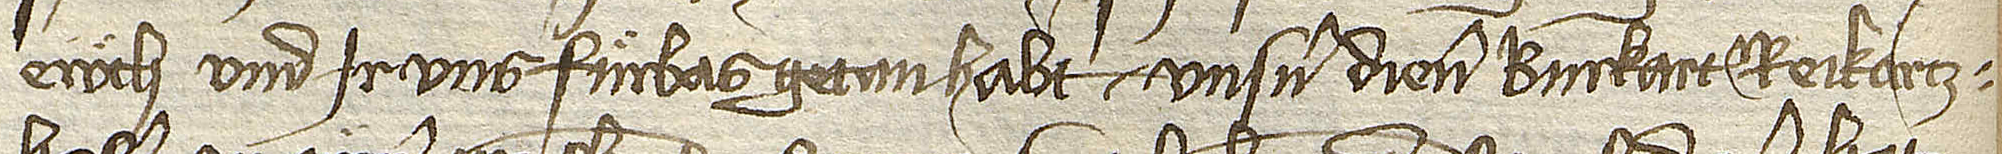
eẅch vnd Ir vns fürbas getan habt / vnſn* dien* Burkart* Reikarcʒ =
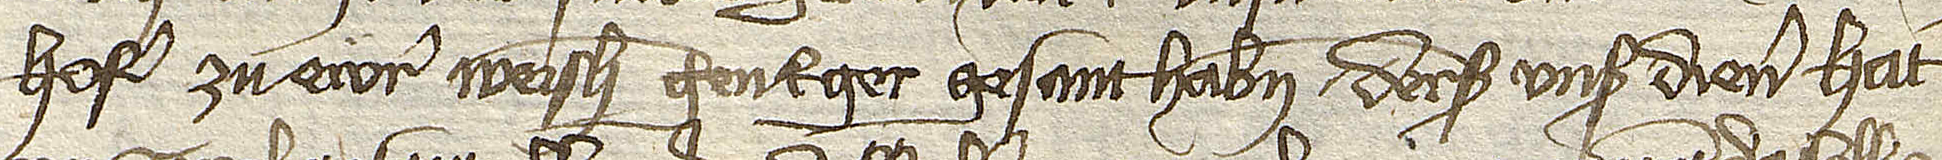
hof* ʒu eẅr* weiſh* gen Eger geſant habn* / Derſ* vnſ* dien* hat
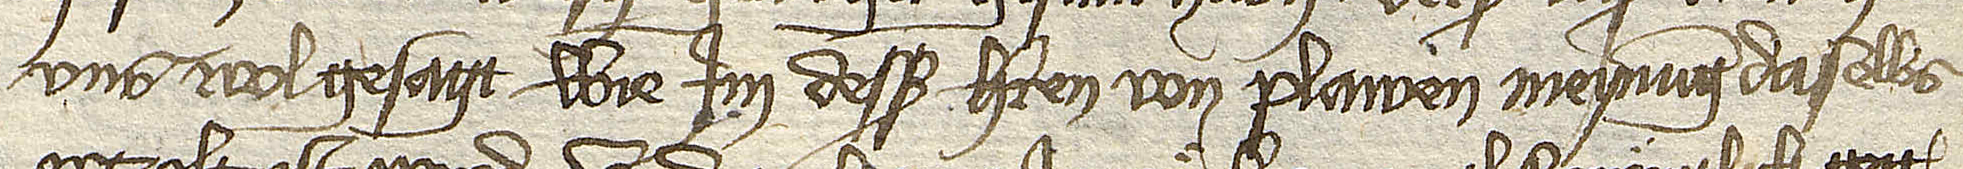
vns / wol geſagt Wie Im deſſ* h*ren von Plawen meynu*g daſelbs
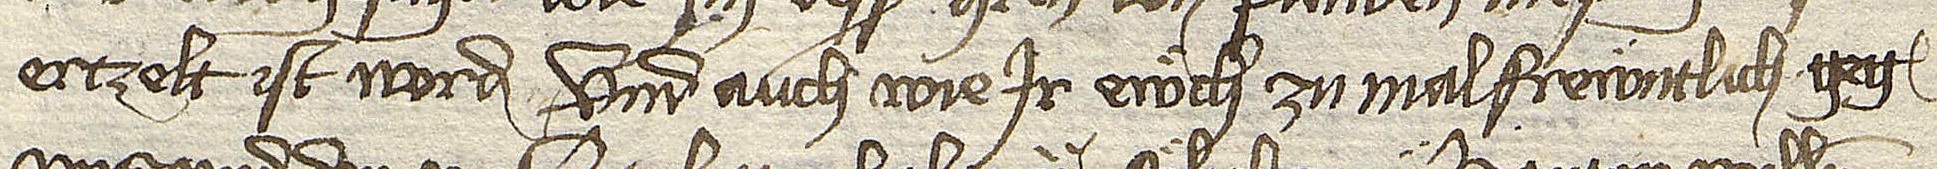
ercʒelt iſt word* / Vnd auch wie Ir eẅch ʒu mal freẅntlich geg*
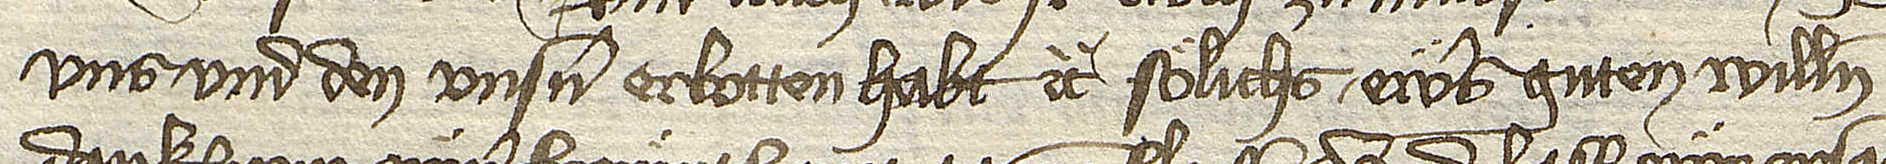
vns vnd den vnſn* erbotten habt ec* . ſölichs / eẅ*s guten willn*
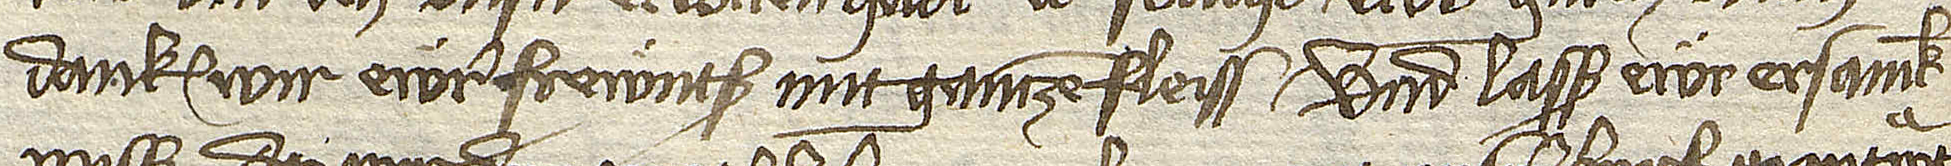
dank* wir eẅr* freẅntſ* mit gancʒe* fleiſſ / Vnd laſſ* eẅr erſamk*
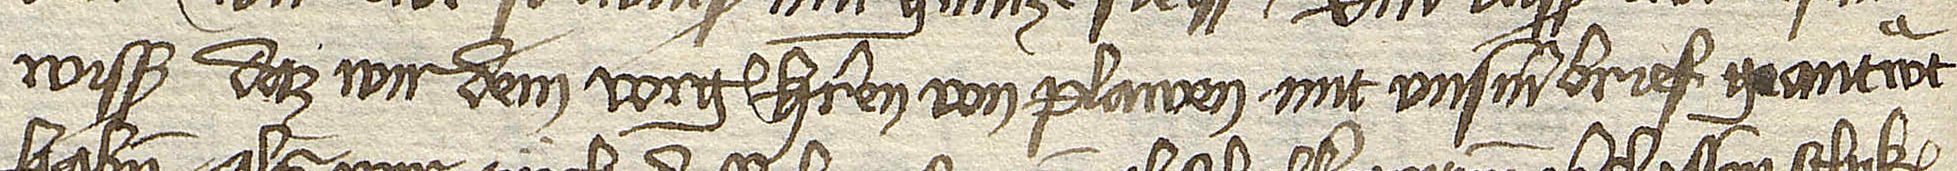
wiſſ* Daʒ wir dem vorg* h*ren von Plawen . mit vnſ*m brief geantw*t
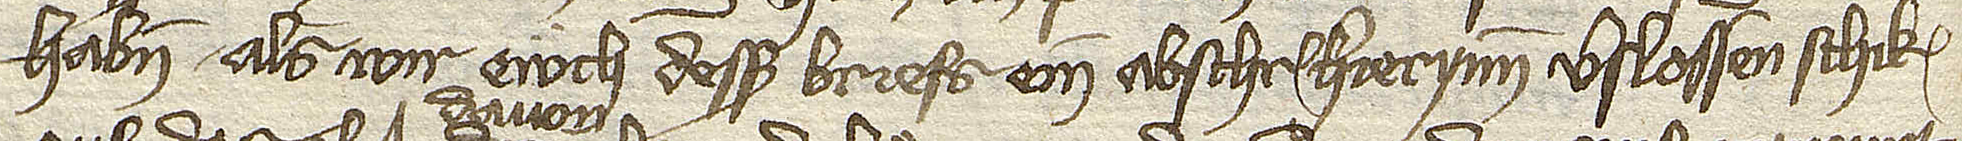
habn* / als wir eẅch deſſ* briefs ein abſchr* hierynn* v*ſloſſen ſchik*
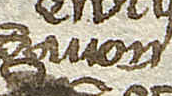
dauon
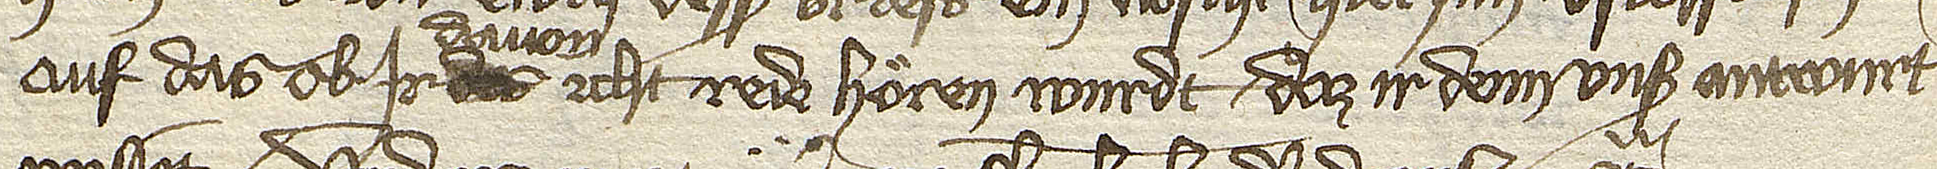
auf das ob Ir das icht rede hören wurdt / daʒ ir denn vnſ* antwurt
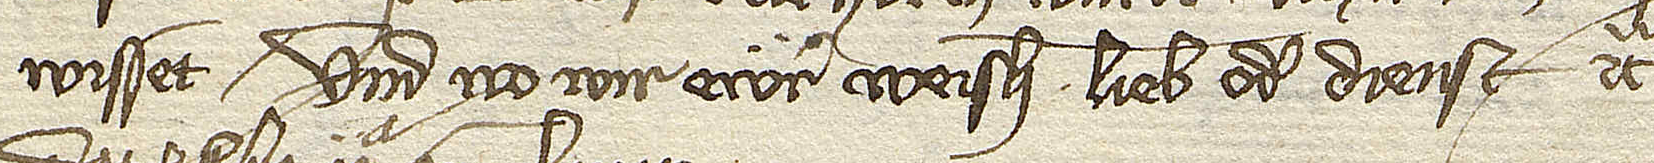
wiſſet / Vnd wo wir eẅr* weiſh* lieb od* dienſt ec*
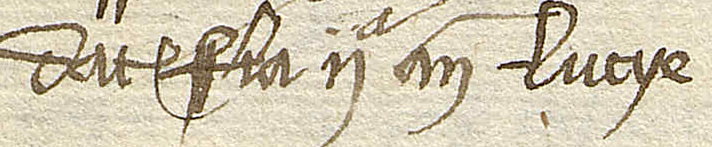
Dat* fi*a ii* an* Lucye
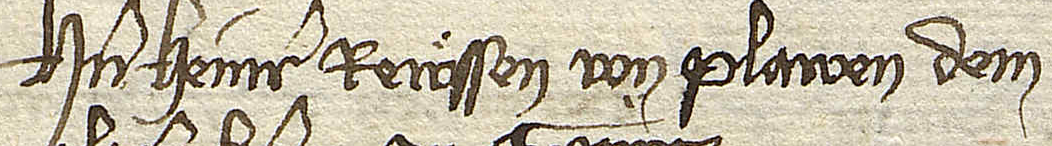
Hn* heinr* Reẅſſen von Plawen dem
